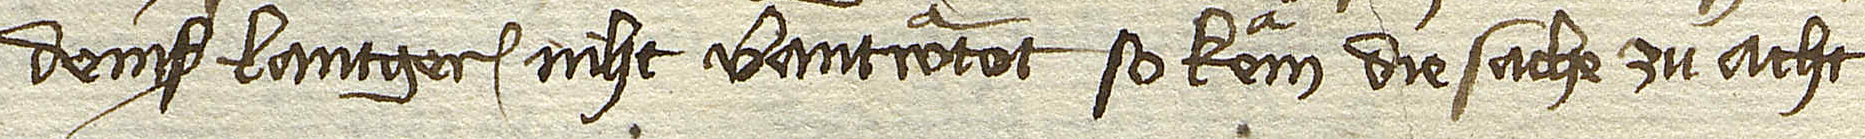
demſ* lantger* niht v*antw*tet ſo këm die ſache ʒu acht
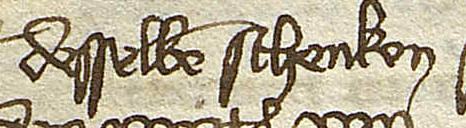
deſſelbe* ſchenken
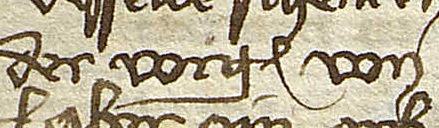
der vorg* von
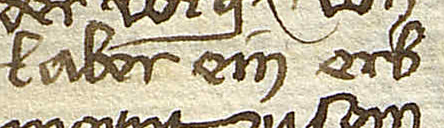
laber ein erb
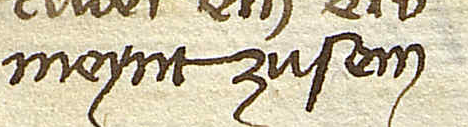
meynt ʒuſein
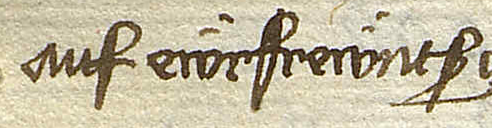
auf ewr frewntſ*
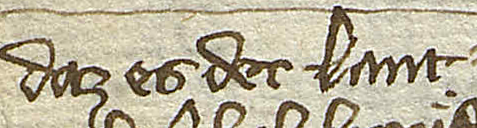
daʒ es der lant =
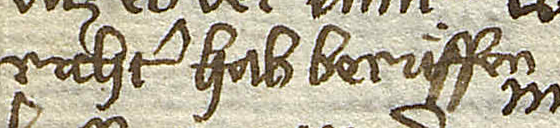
richt* hab berüffen
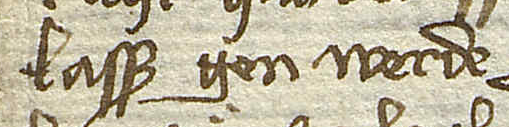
laſſ* gen werde
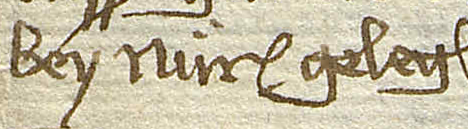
bey Nür* geleg*
